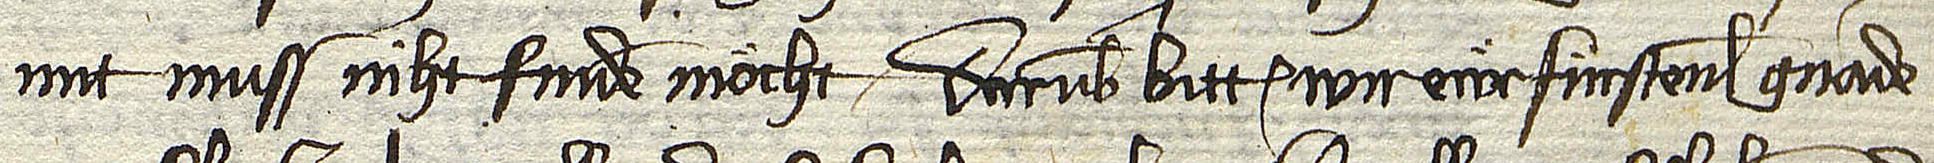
mit muſſ niht finde* möcht / Daru*b bitt* wir ewr fürſtenl* gnade
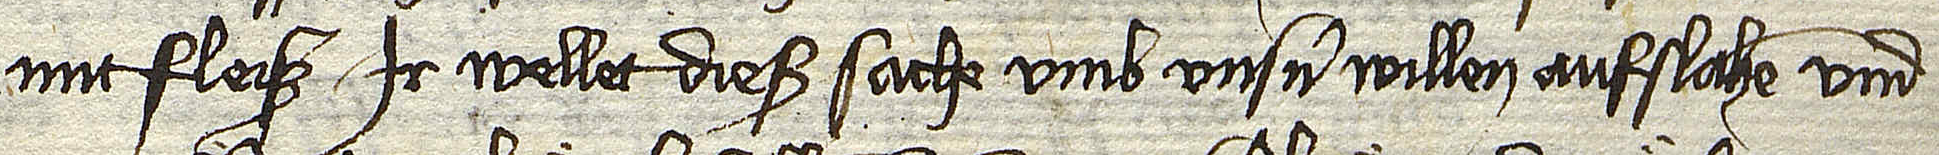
mit fleiſʒ / Ir wellet dieſ* ſache vmb vnſ*n willen aufſlahe* vnd
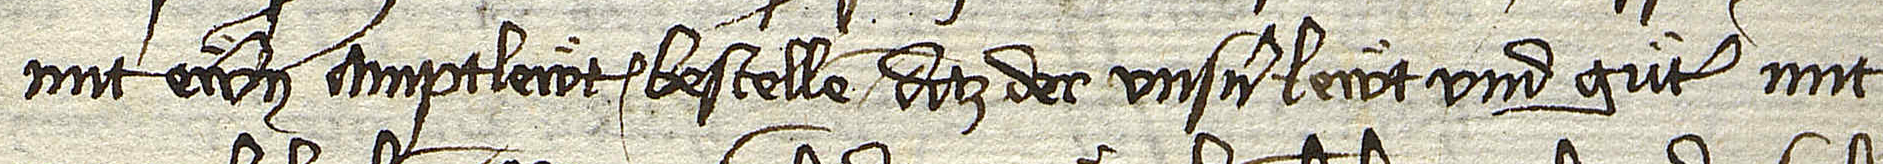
mit ew*n amptlewt* beſtelle* / daʒ der vnſ*n lewt vnd güt* mit
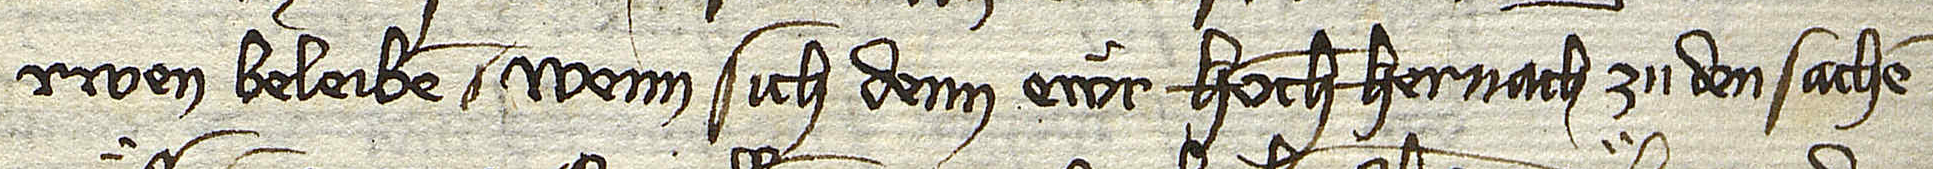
rwen beleibe* / wenn ſich denn ewr hoch* hernach ʒu den ſache*
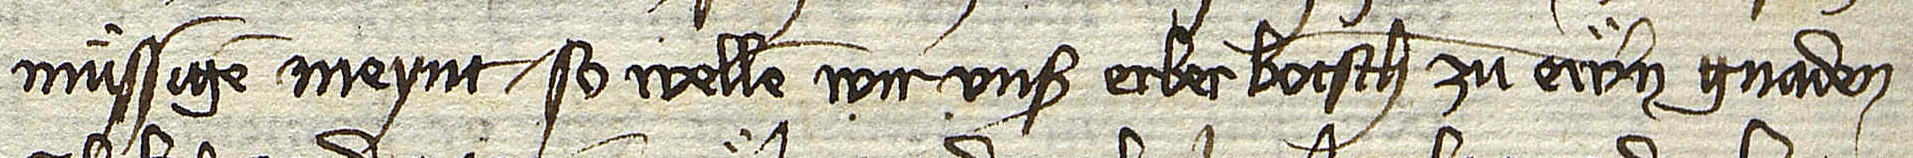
müſſige* meynt / ſo welle* wir vnſ* erber botſch* ʒu ew*n gnaden
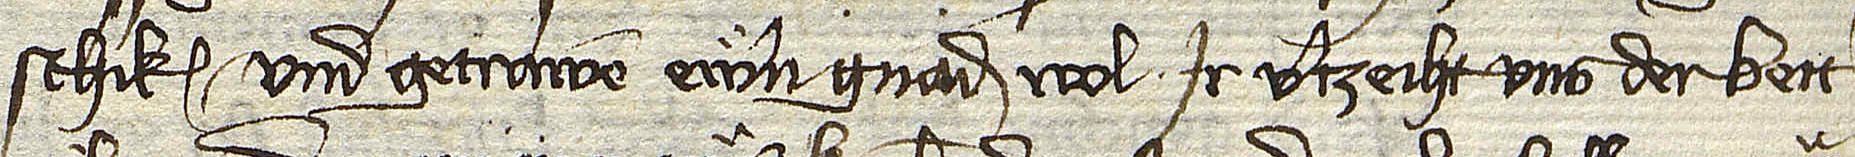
ſchik* / vnd getrawe* ew*n gnad* wol . Ir v*cʒeiht vns der bett
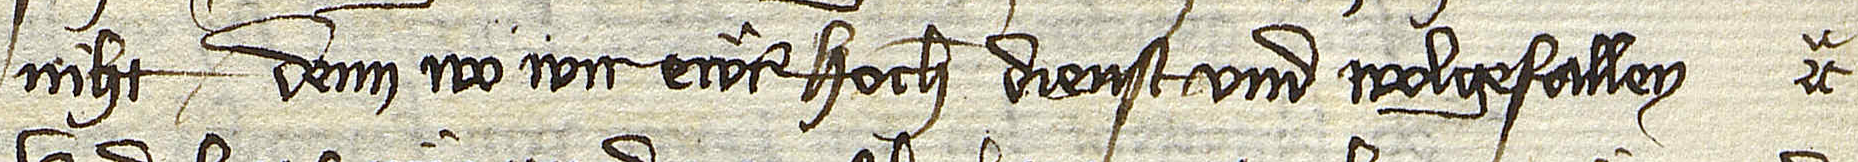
niht / Denn wo wir ew*r hoch* dienſt vnd wolfgefallen ec*
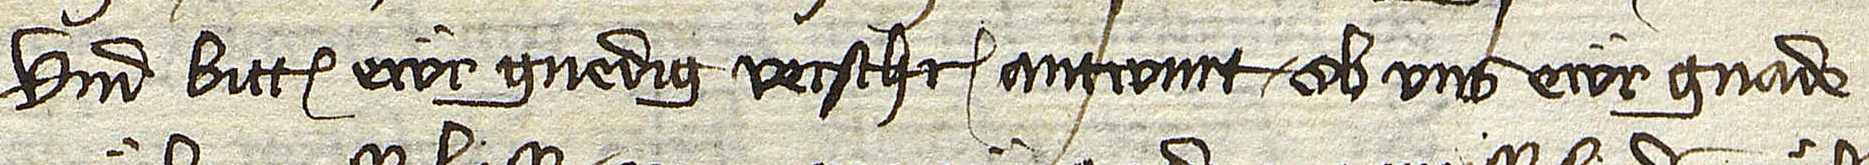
Vnd bitt* ewr gnedig verſchr* antwurt / Ob vns ewr gnade
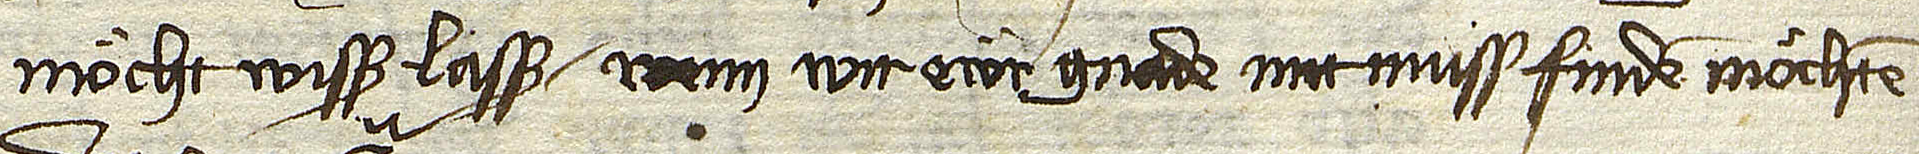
möcht wiſſ* laſſ* / wenn wir ewr gnade mit muſſ finde* möchte*
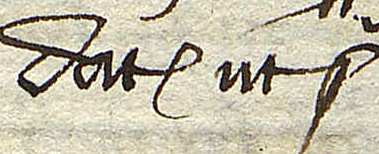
Dat* ut ſ*
